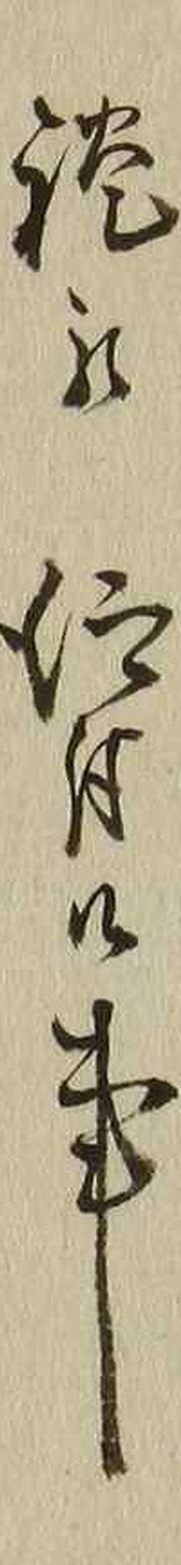談被仰付候事
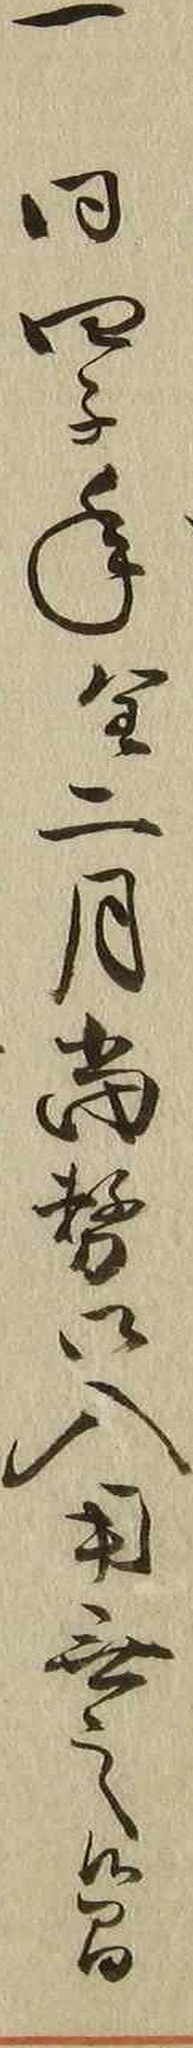一同四子年閏二月当務口入用無之候間
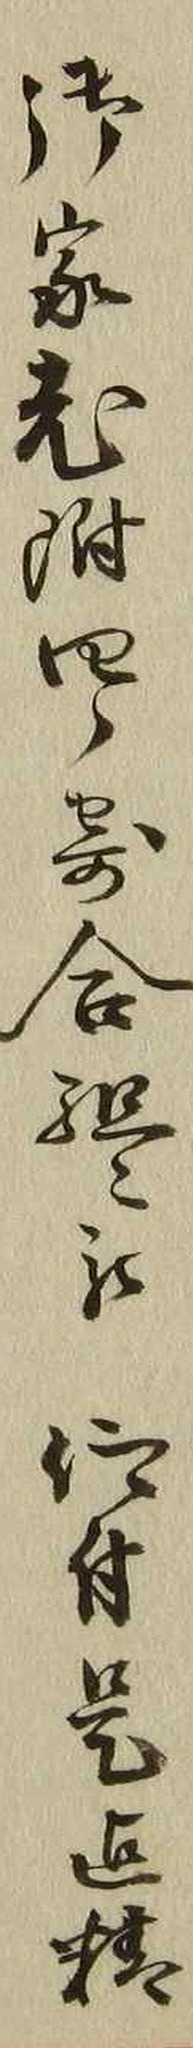御家老就四ノ寄合組ニ被仰付是迄精
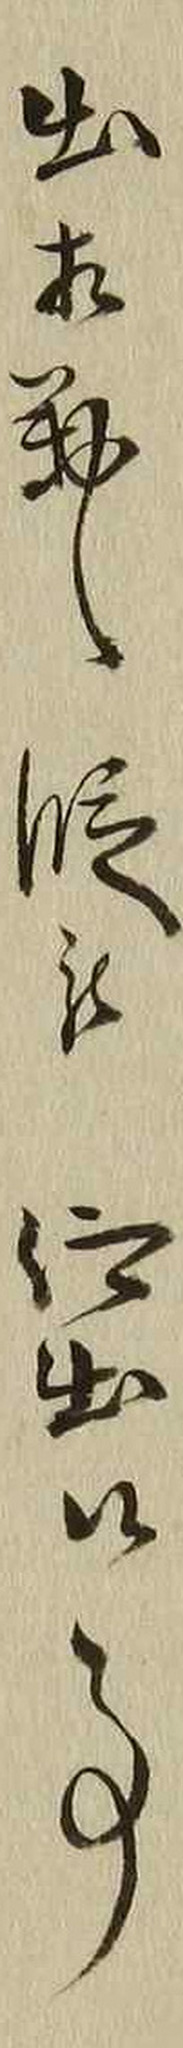出相勤候段被仰出候事
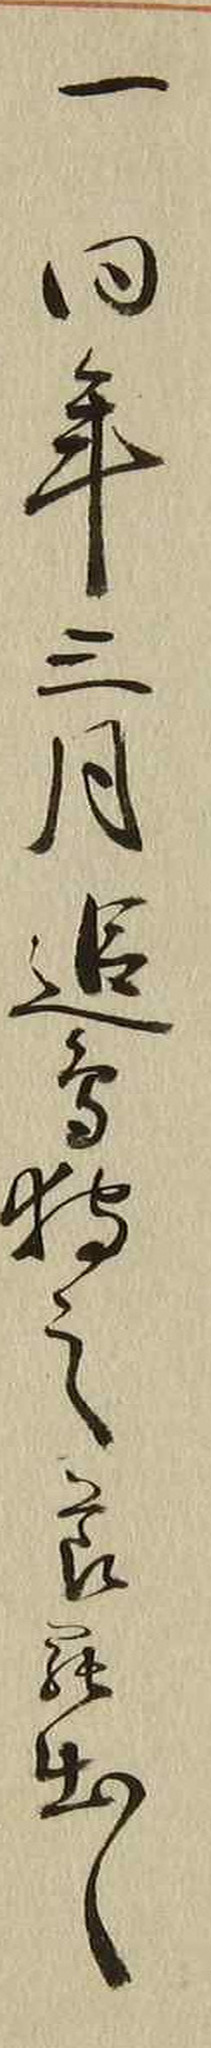一同年三月迄鳥狩之節罷出候
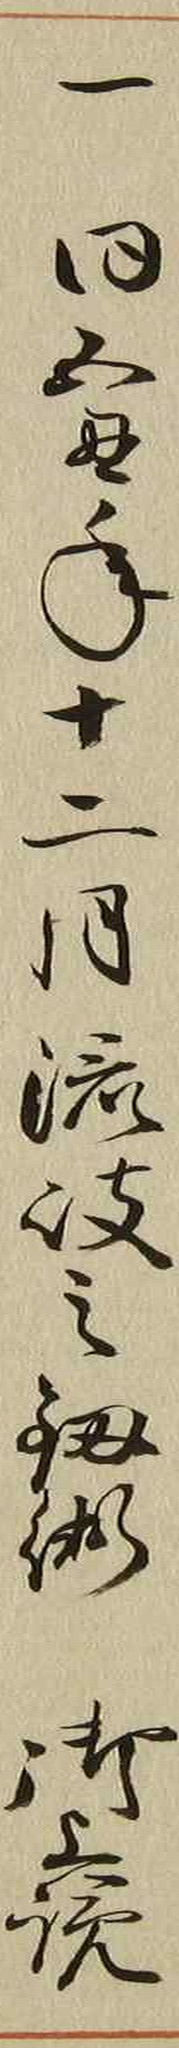一同五丑年十二月流岐之釼術御上覧
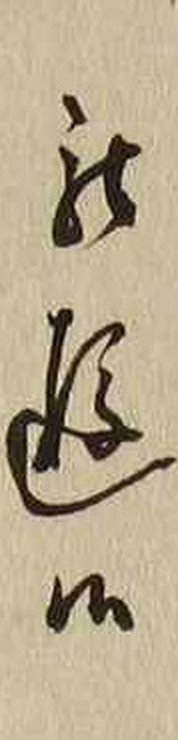被遊候
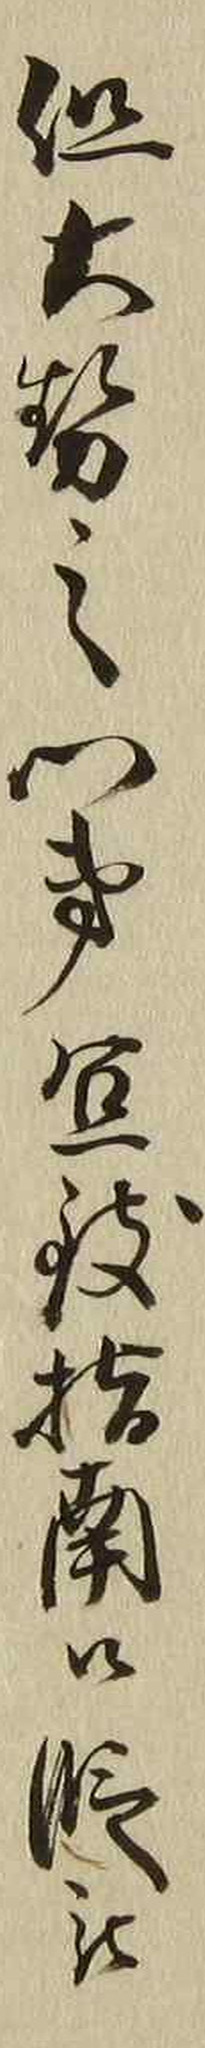但大勢之門弟宜致指南候段被
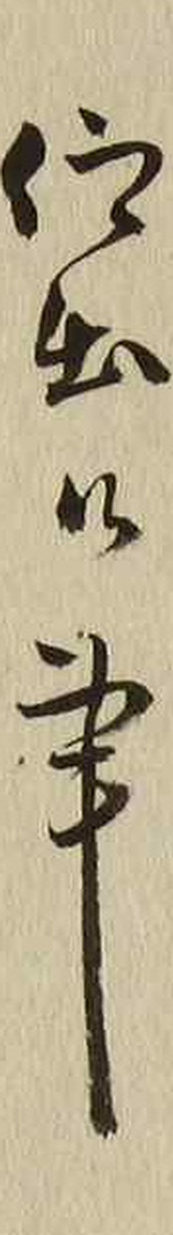仰出候事
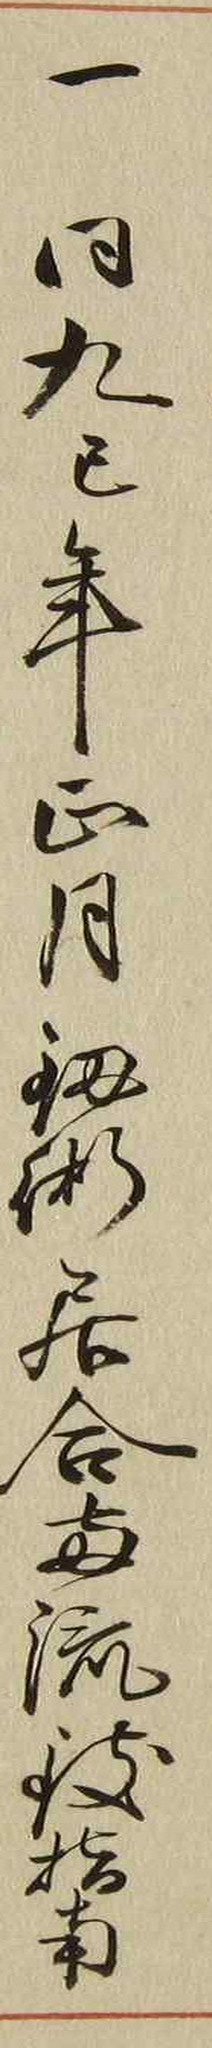一同九巳年正月釼術居合両流致指南
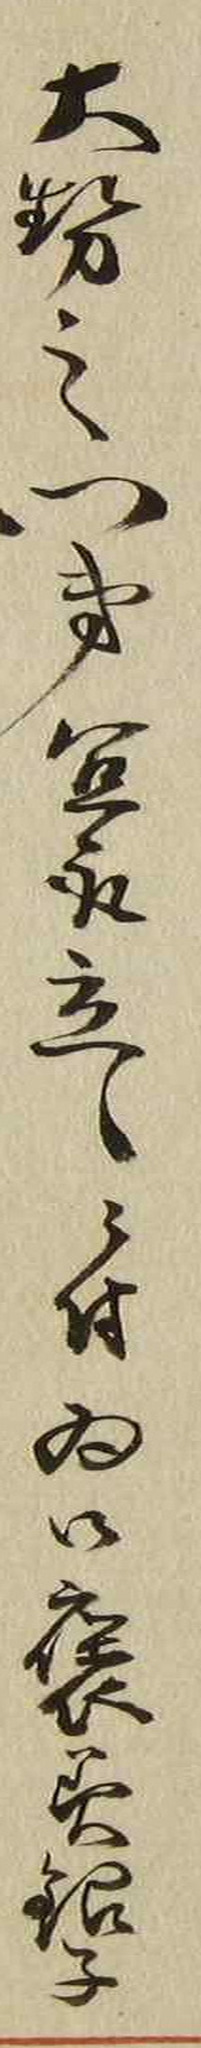大勢之門弟宜取立候ニ付為御褒美銀子
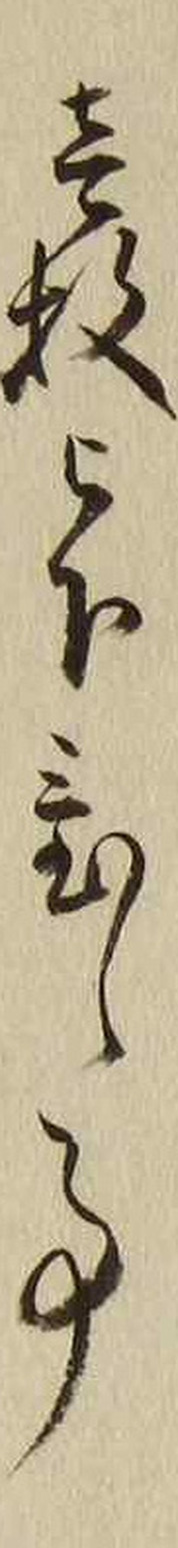壱枚被下置候事
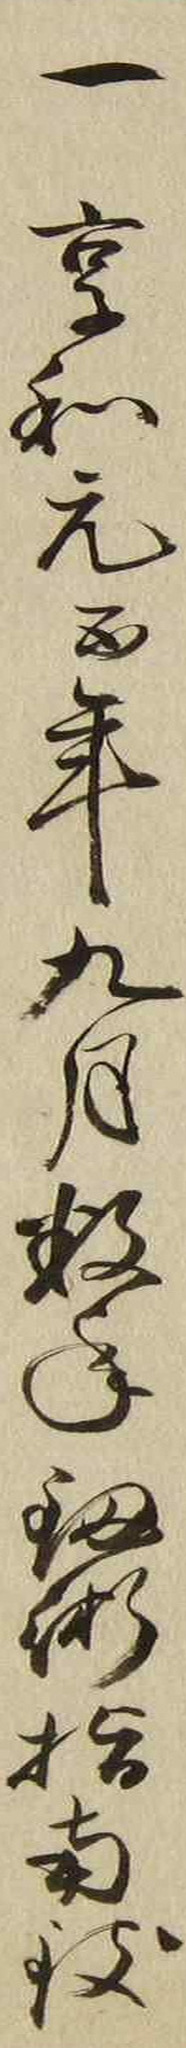一享和元酉年九月数年釼術指南致
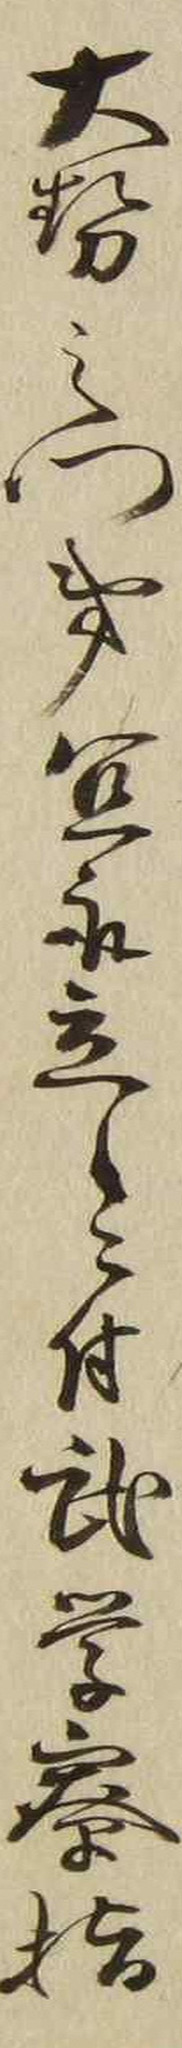大勢之門弟宜取立候ニ付武学寮指

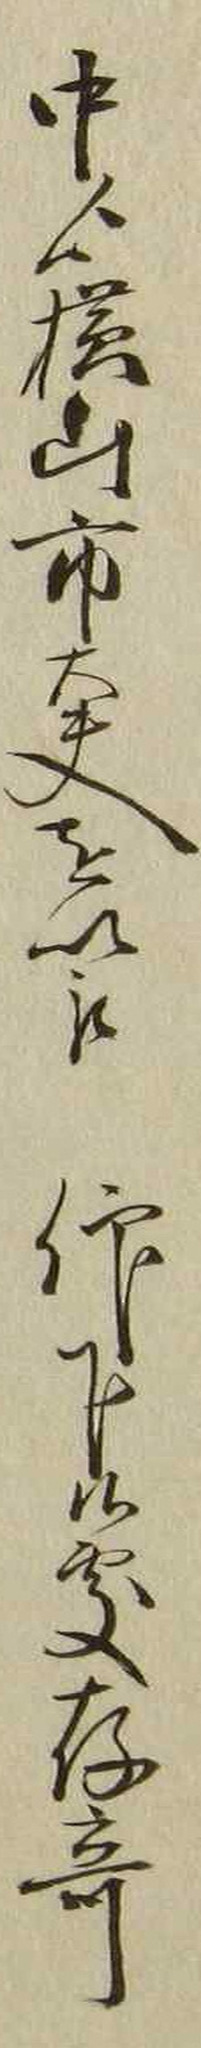中ゟ横山市太夫を以被仰下候處存奇
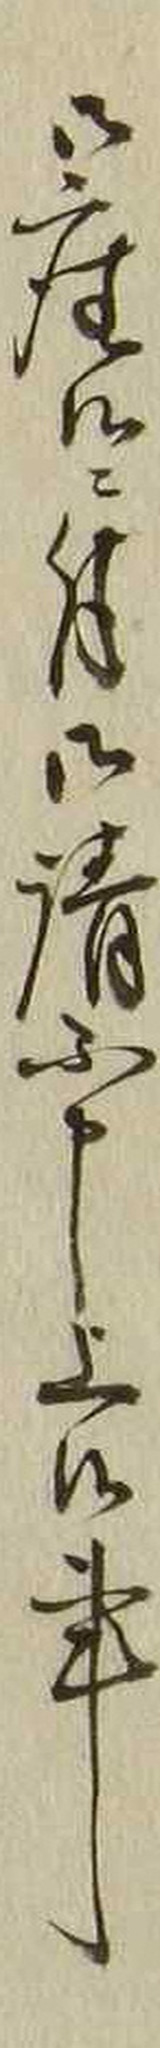御座候ニ付御請不申上候事
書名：諸士系譜　巻之65　ち之部1
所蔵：会津若松市立会津図書館
